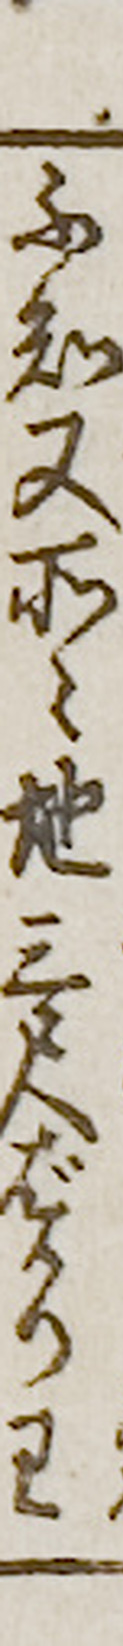不知又所々地三尺ばかりわ
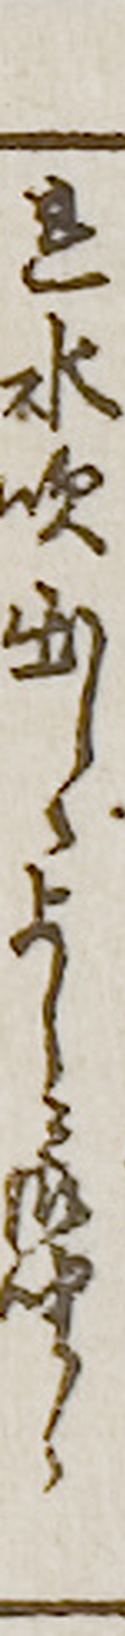れ水吹出し候よしに御座候
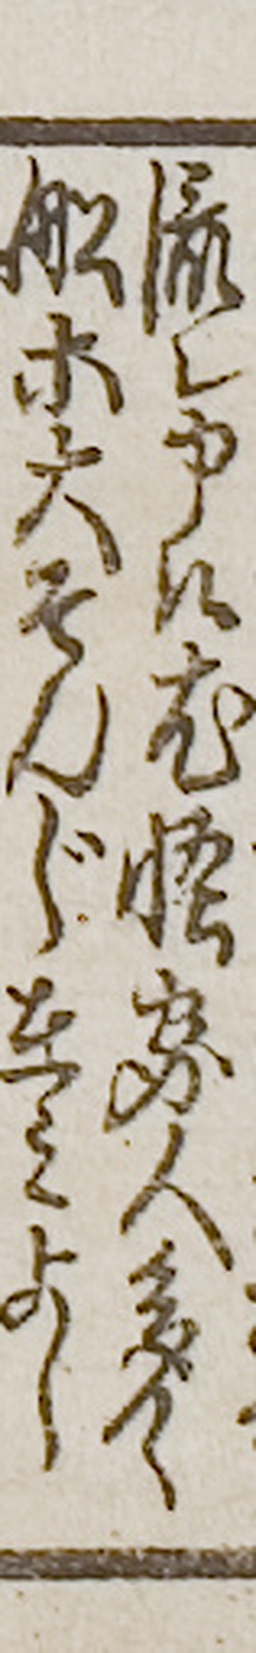船等大そんじ在之よし
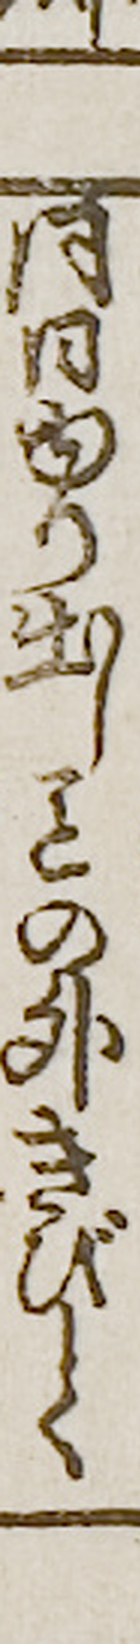同日ゆり出しことの外きびしく
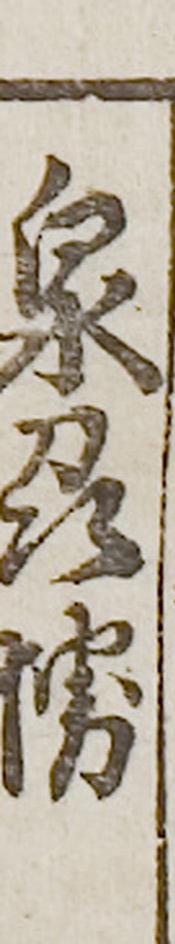泉州堺
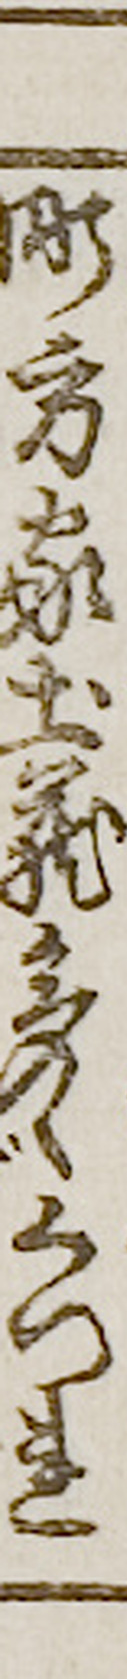町方家土蔵多くくつれ
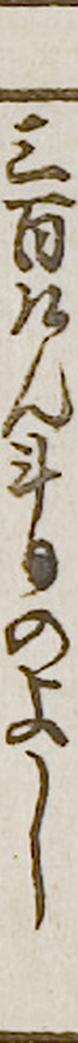三百けん斗りのよし
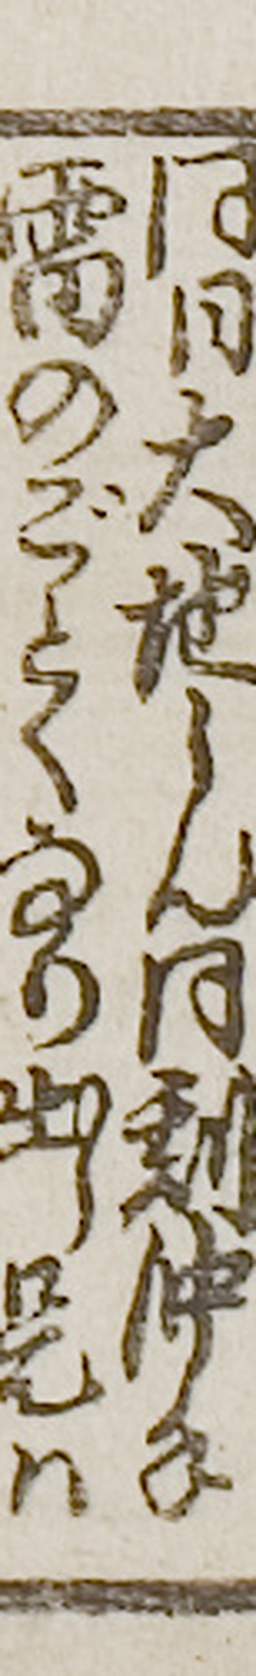雷のごとくなり出し是は
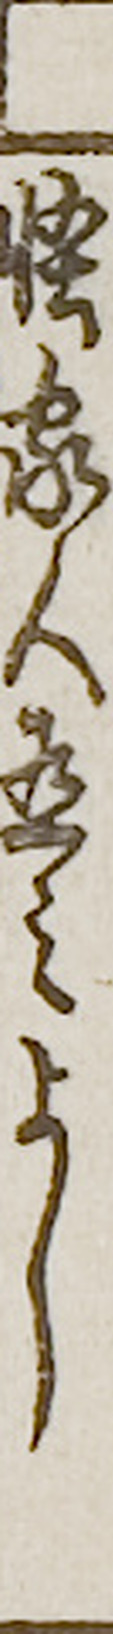怪我人有之よし
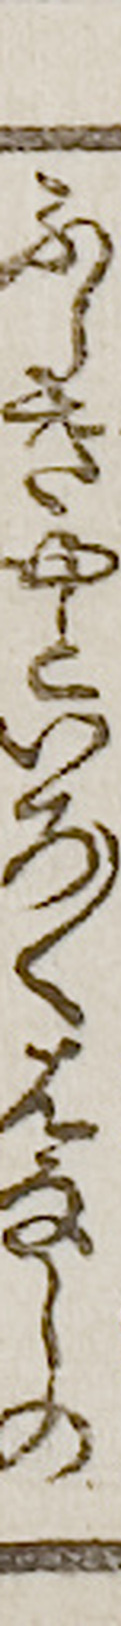ふしきやといろ〳〵はなしの
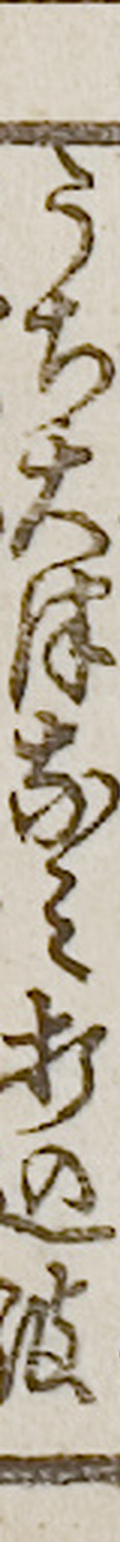うち大津なみ打込破
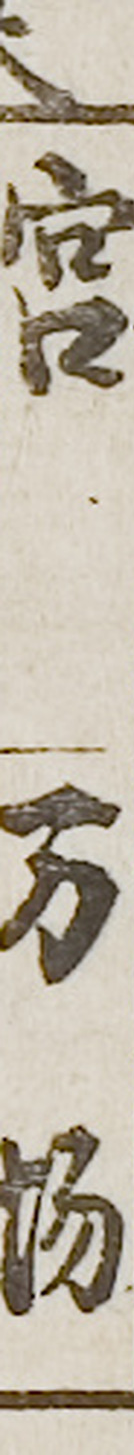宮万場
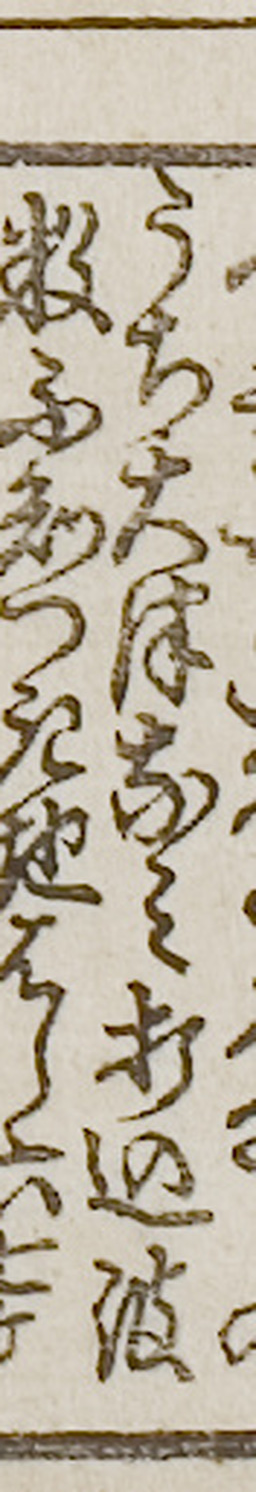数不知つき地はし六七ケ
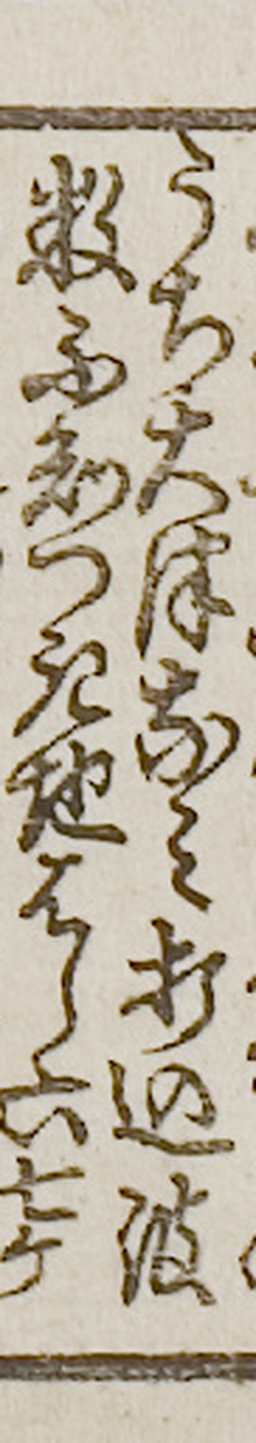数不知つき地はし六七ケ
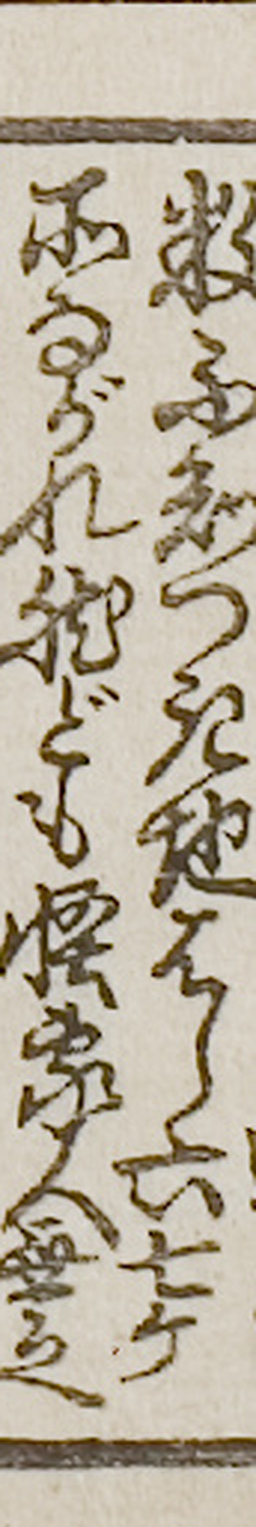所ながれ然ども怪我人無之
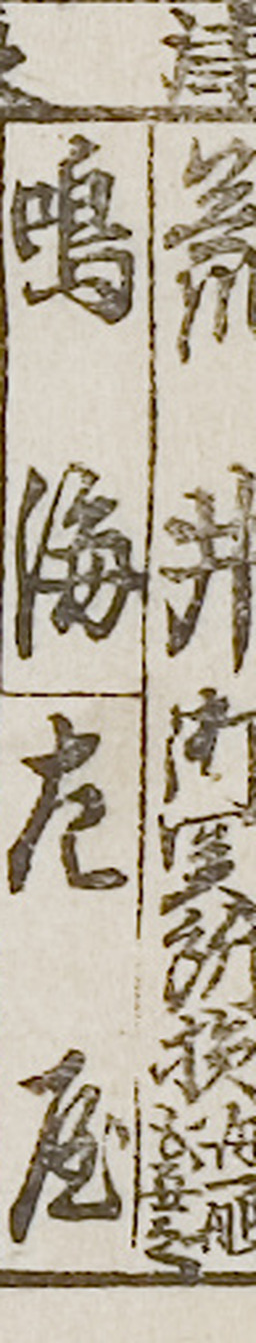鳴海左屋
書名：大阪大地震一覧
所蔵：東京大学総合図書館 General Library in the University of Tokyo, JAPAN
